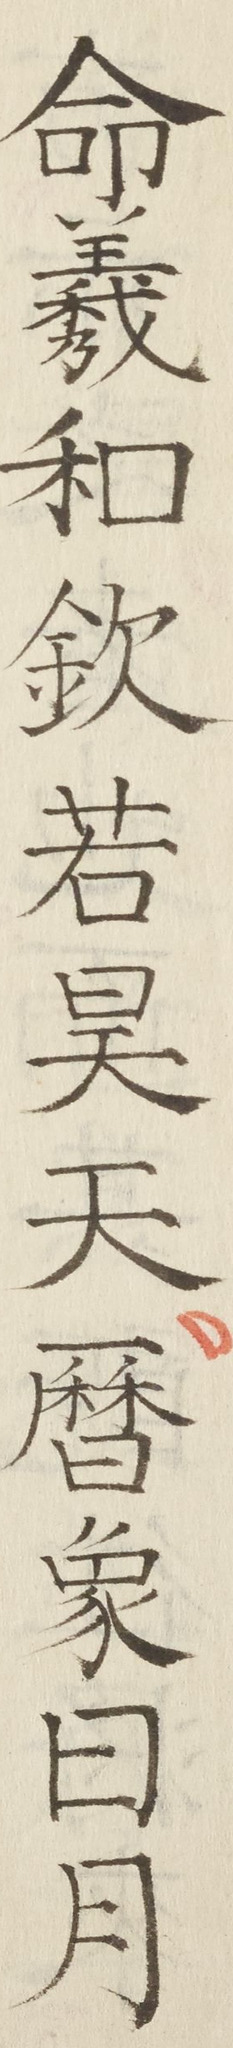命義和欽若昊天。暦象日月
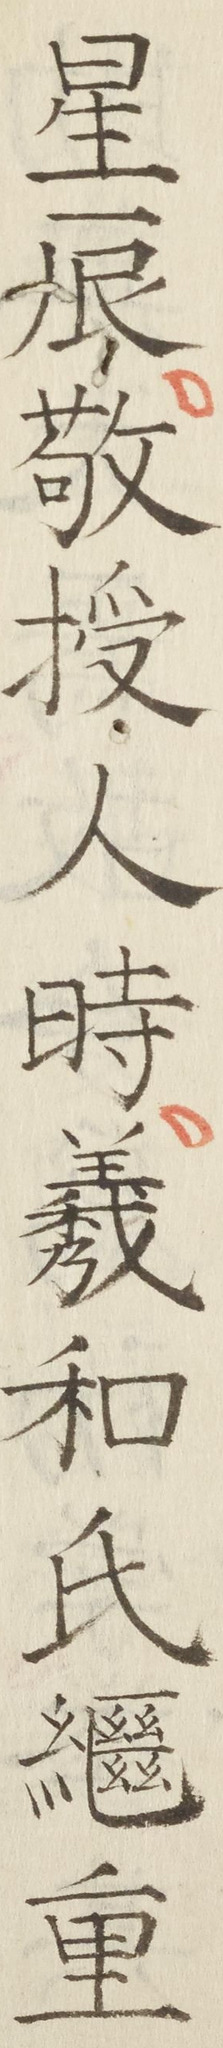星辰。敬授人時。義和氏継重
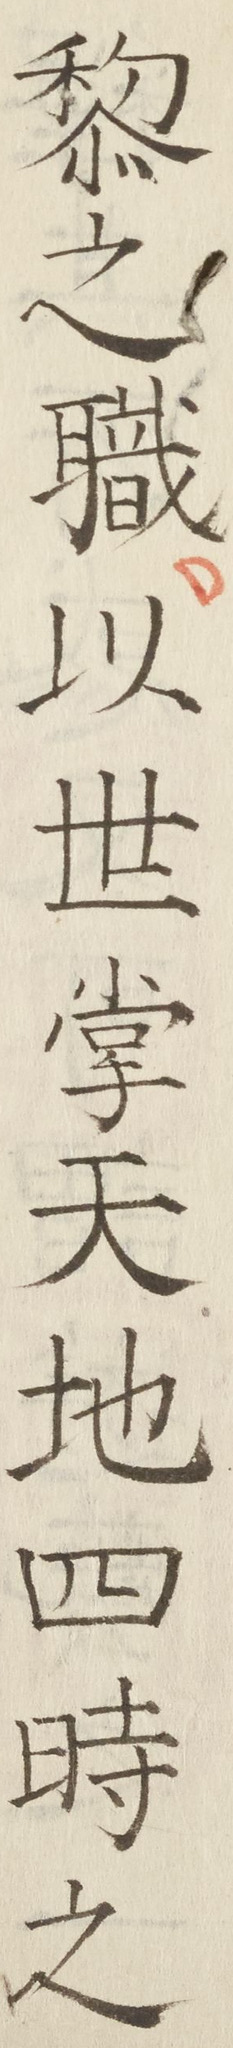黎之職。以世掌天地四時之
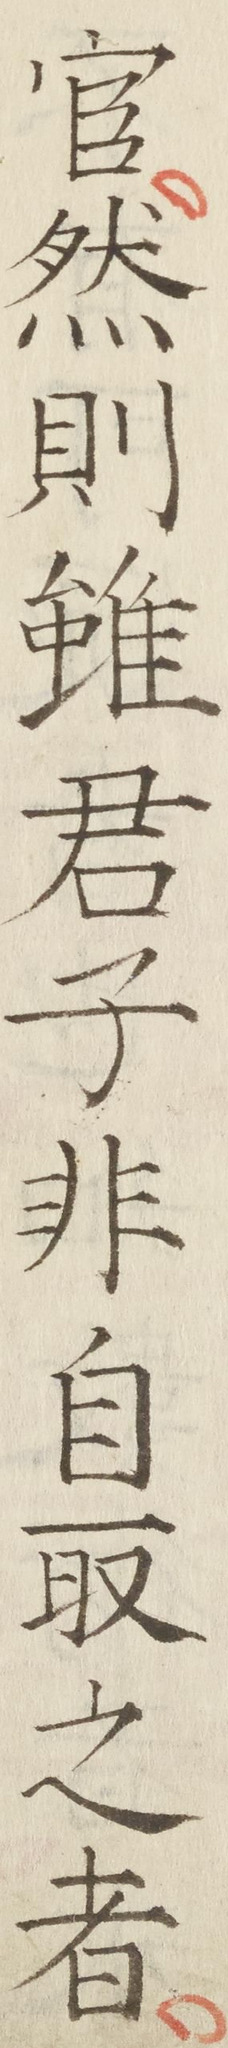官。然則雖君子非自所之者。
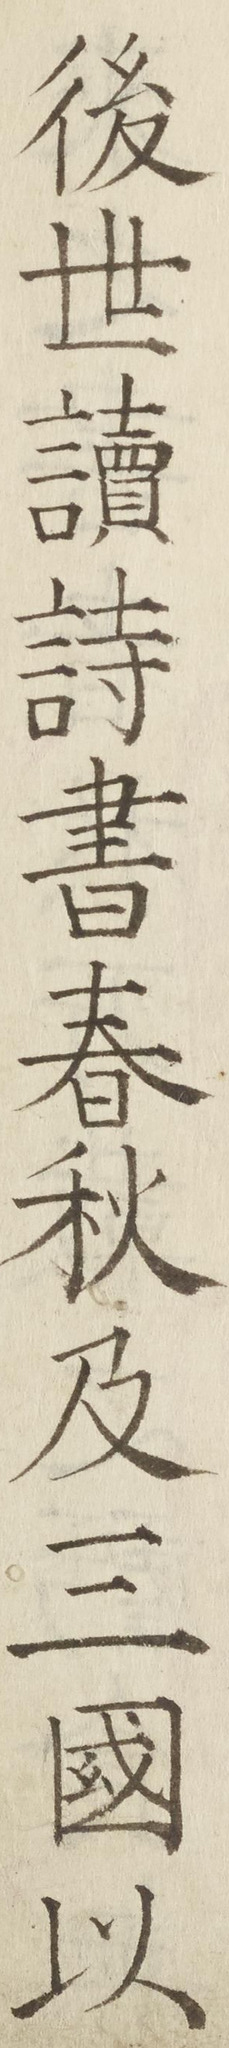後世読詩書春秋及三国以

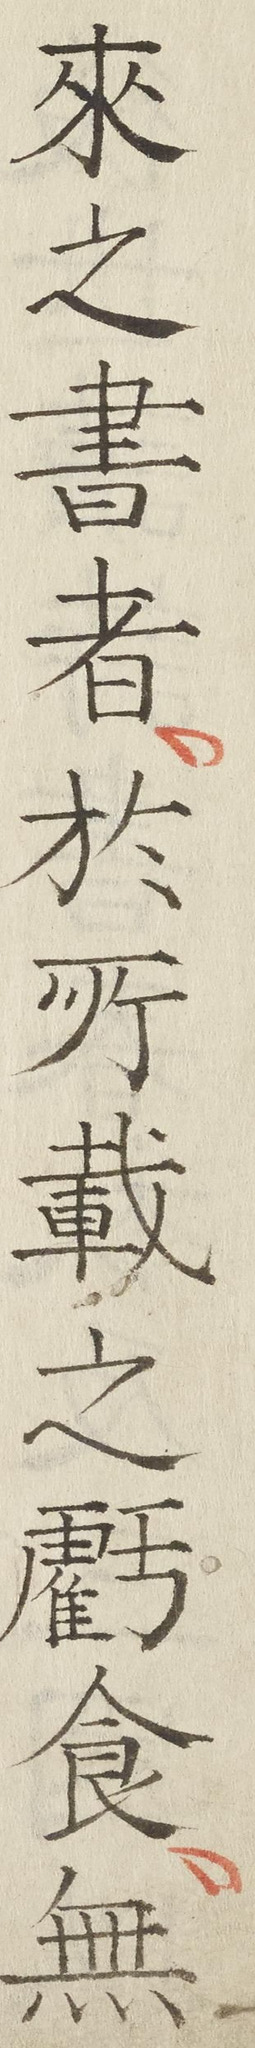来之書者。於所載之虧食。無
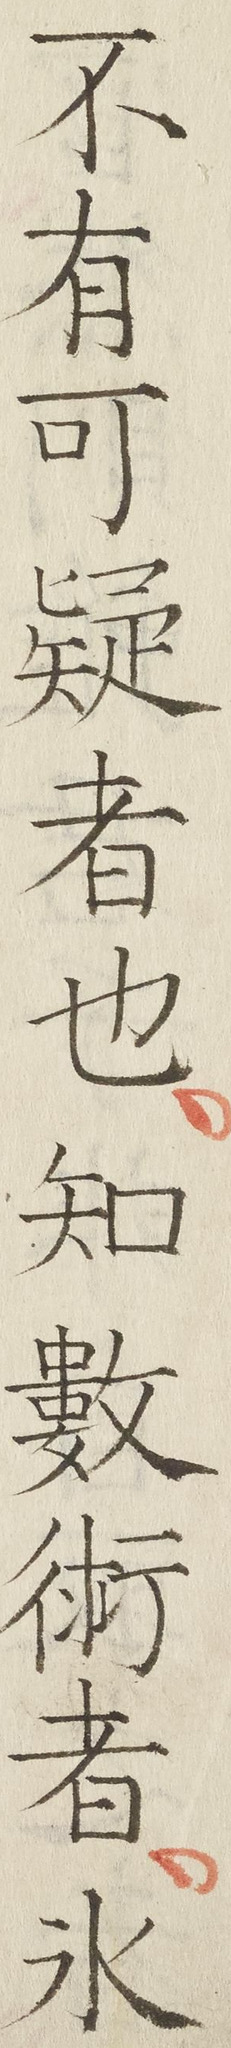不有可疑者也。知数術者。氷
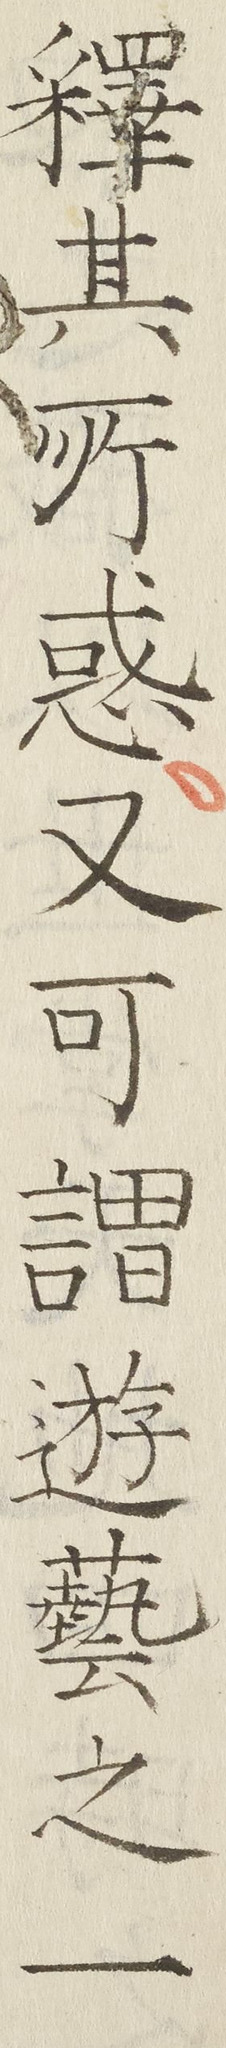釈其所惑。又可謂遊芸之一
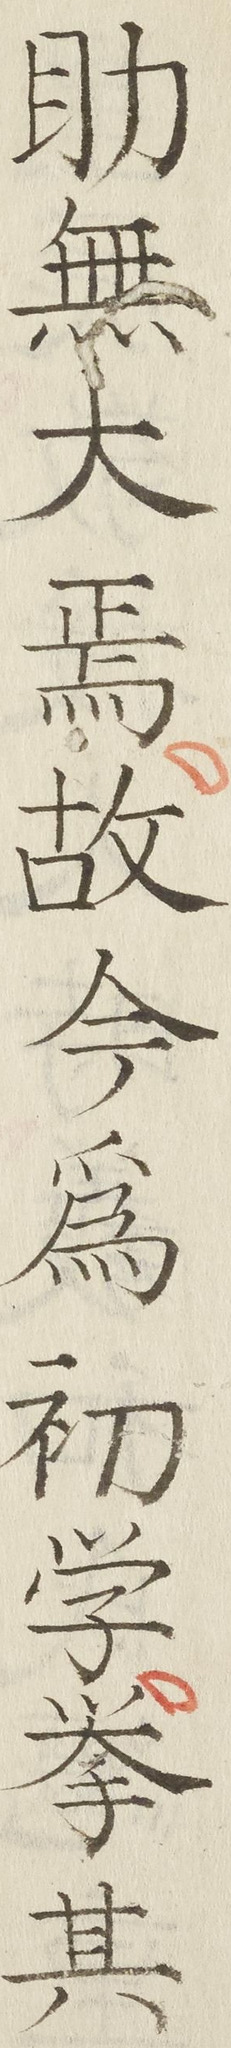助無大焉。故今為初学。挙其
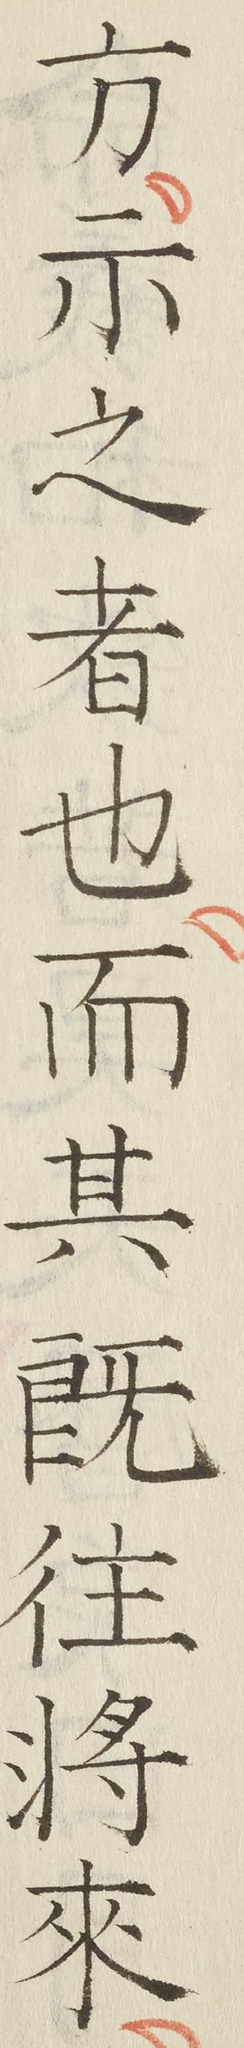方。示之者也。而其既往将来。
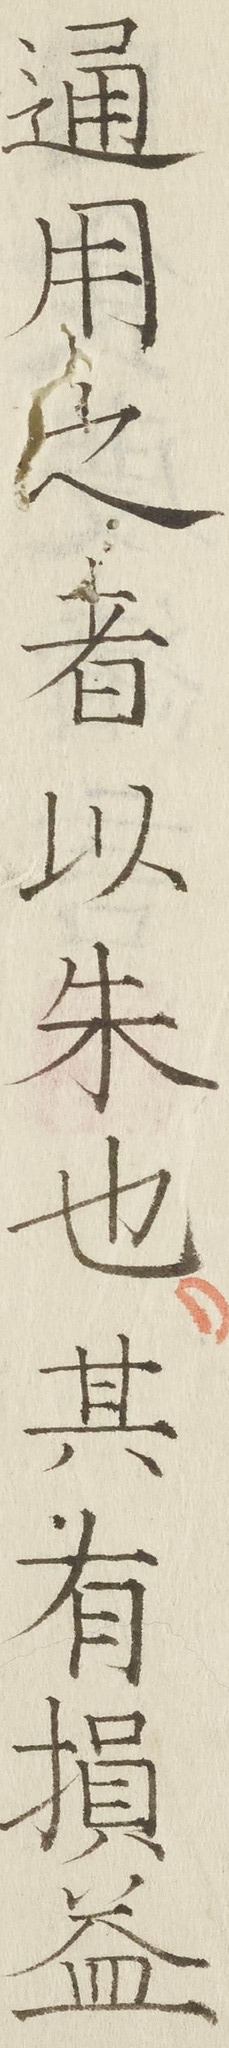通用之者以朱也。其有損益
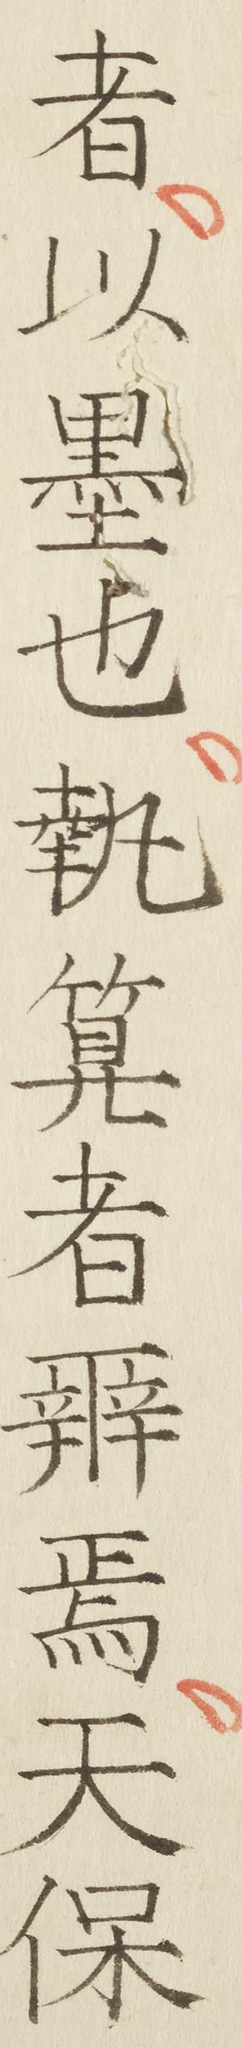者。以墨也。執算者弁焉。天保
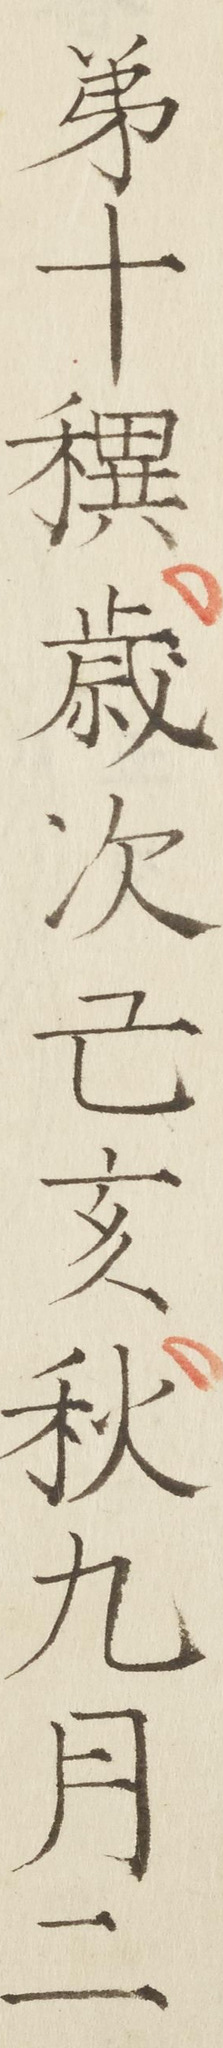第十穓。歳次己亥。秋九月二

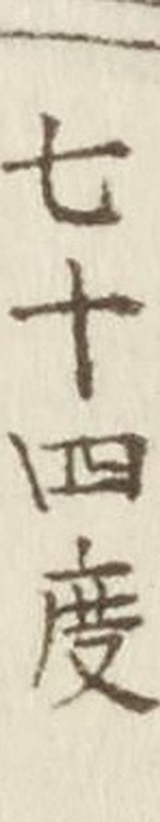七十四度
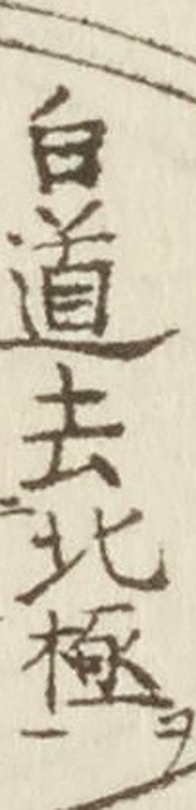白道去北極
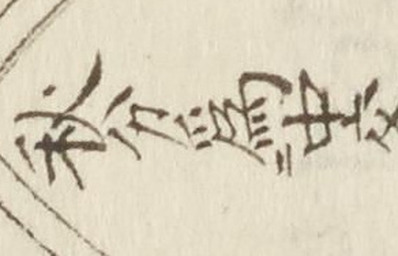秋分為中交
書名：日食度
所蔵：東京大学地震研究所図書室 Earthquake Research Institute Library, The University of Tokyo, JAPAN
